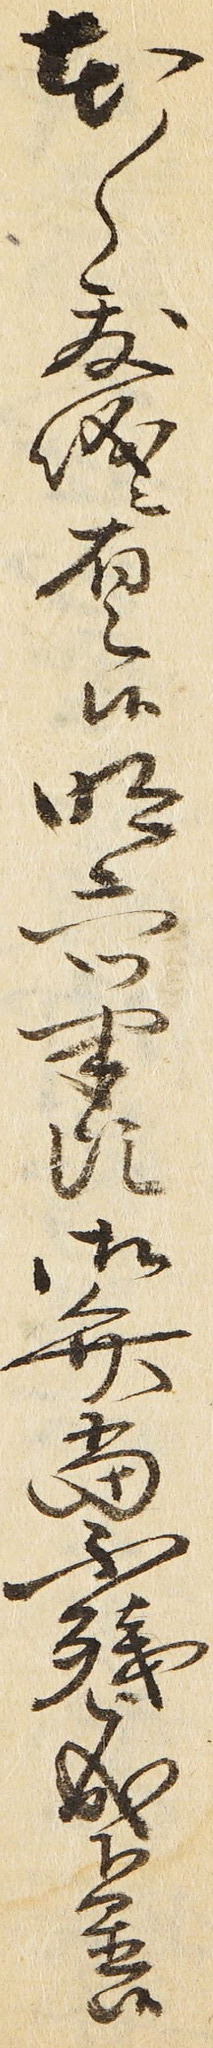花々敷儀に有之候明六ツ半頃御弁当不残被成下置候
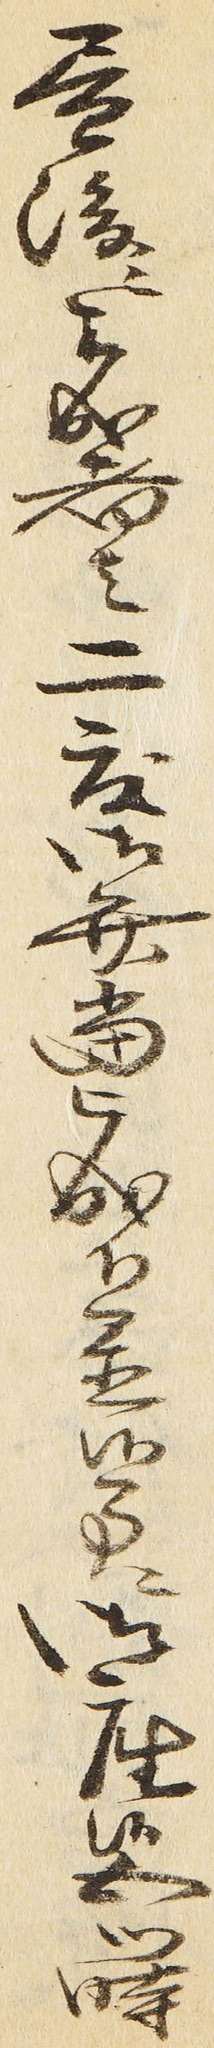昼後に相成者は二度御弁当被成下置候事に御座候五ツ時
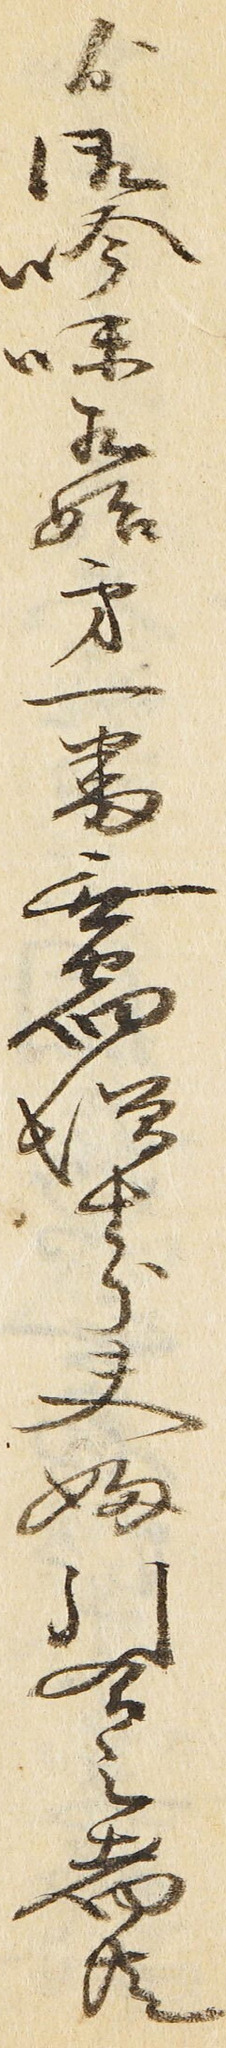ゟ御吟味相始第一番無宿増十郎夫婦引合之者共
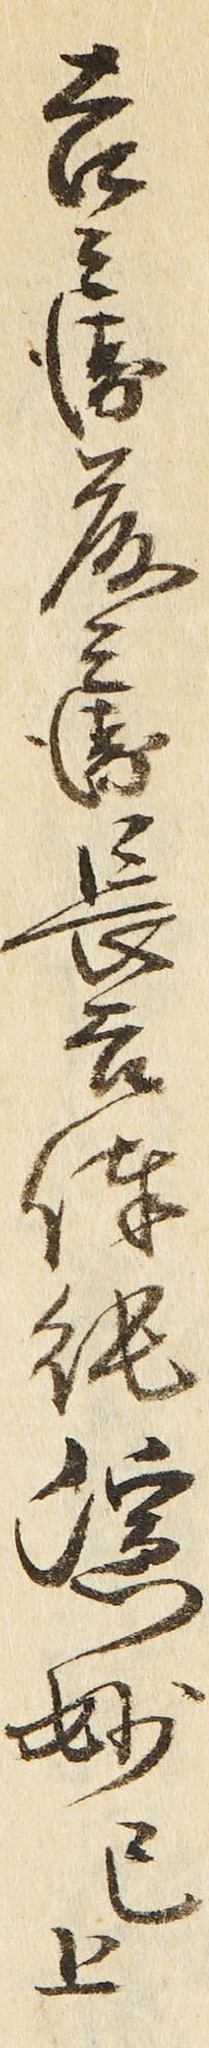吉兵衛藤兵衛長吉俸純演妙已上
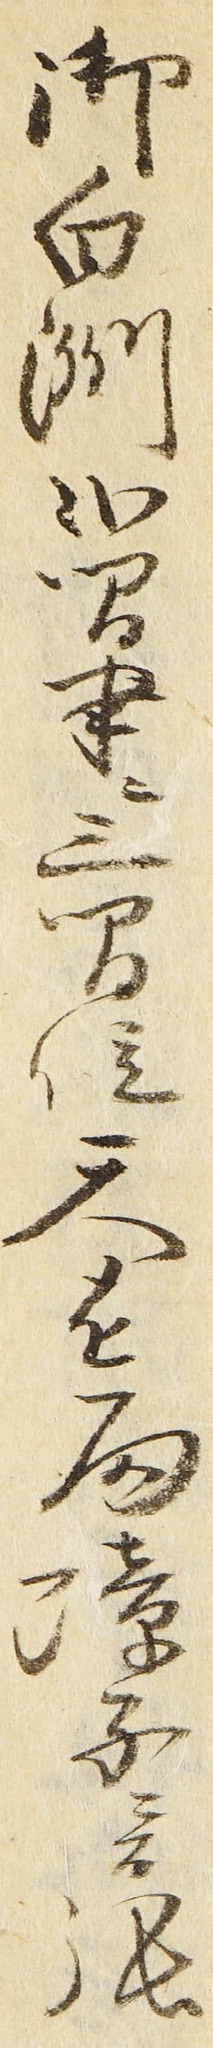御白洲弐間半に三間位天を雨障子に而張
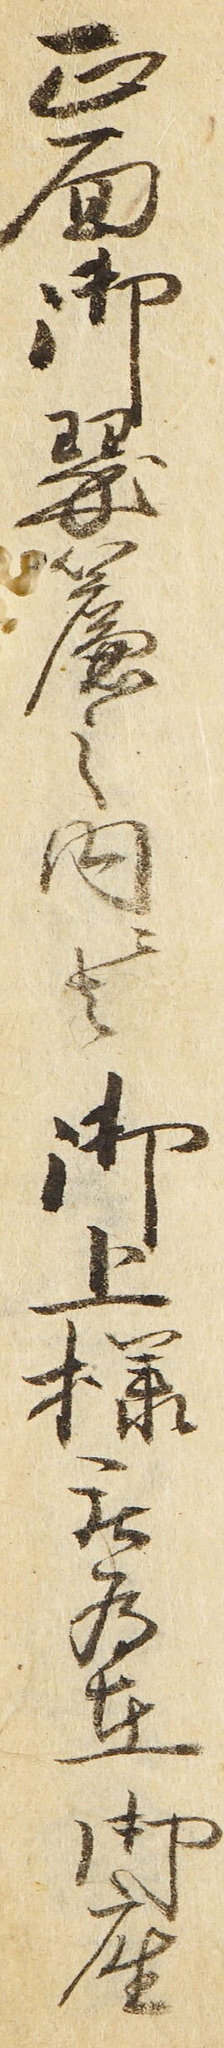正面御翠簾之内には御上様被為在御座

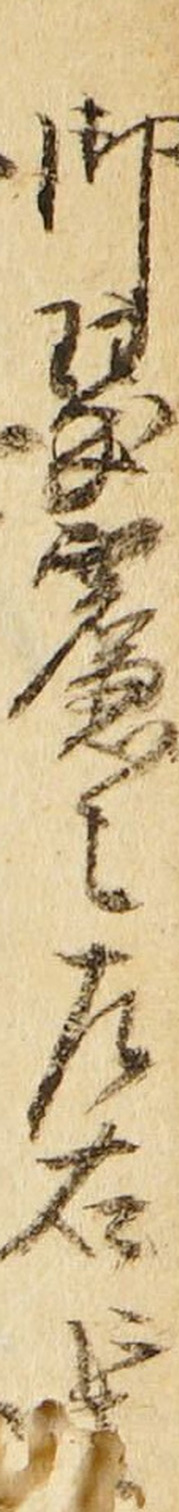御翠簾之左右には
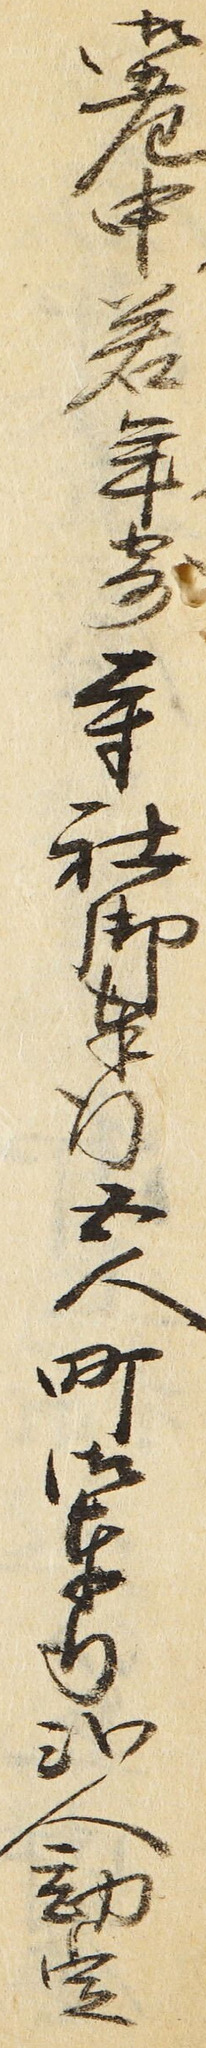御老中若年寄寺社御奉行五人町御奉行弐人勘定
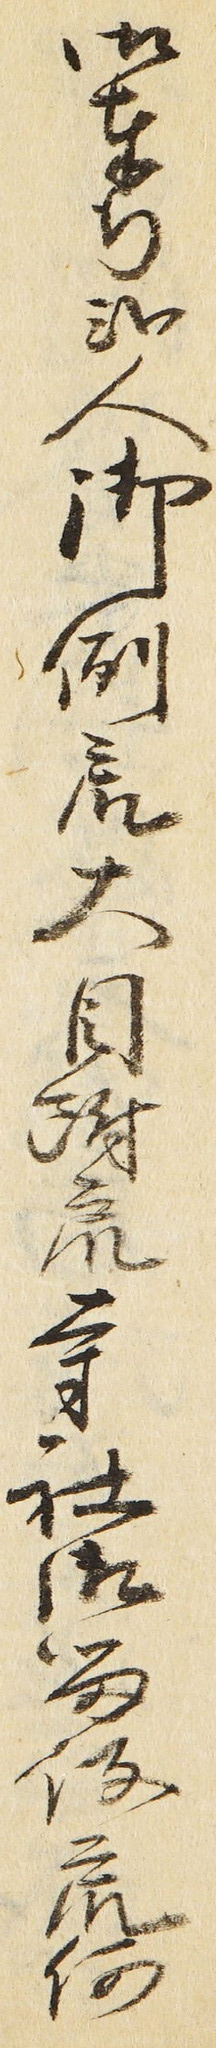御奉行弐人御側衆大目附衆寺社御留役衆何
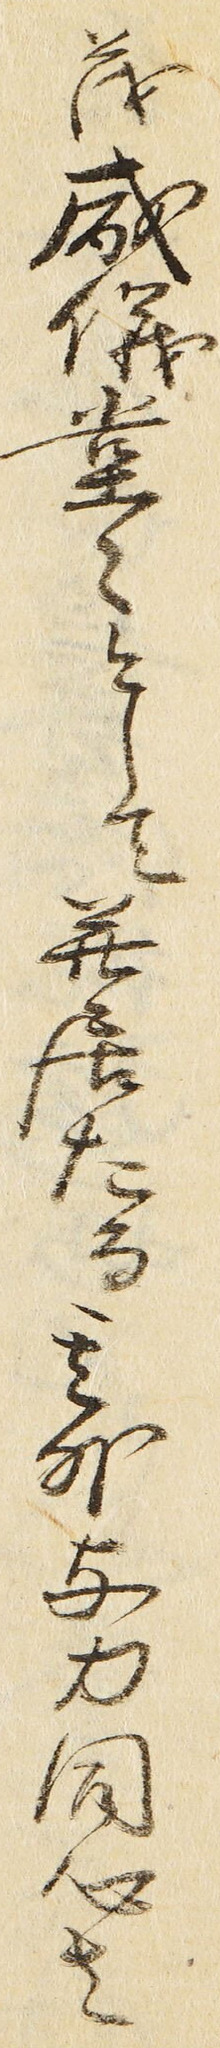も威儀堂々として并居たる其外与力同心は
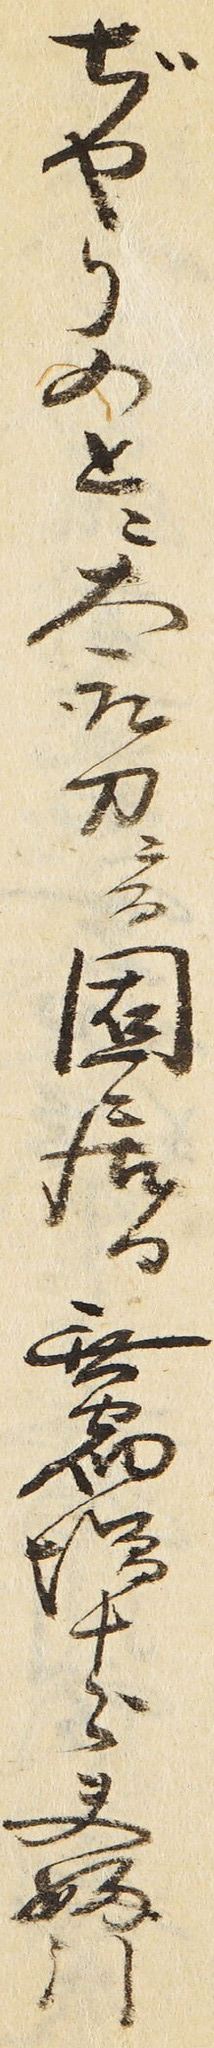ぢやりの上に大取刀に而固居る無宿増十郎夫婦引
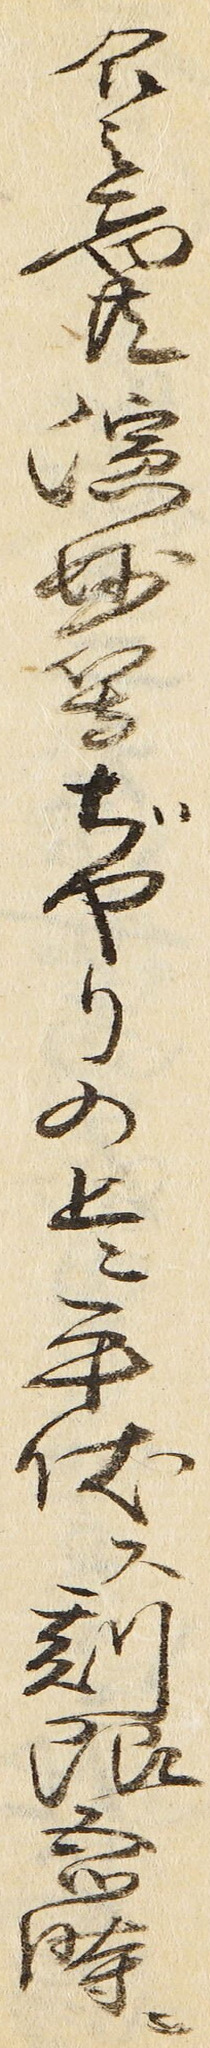合之者共演妙等ぢやりの上に平伏ス刻限五ツ時に
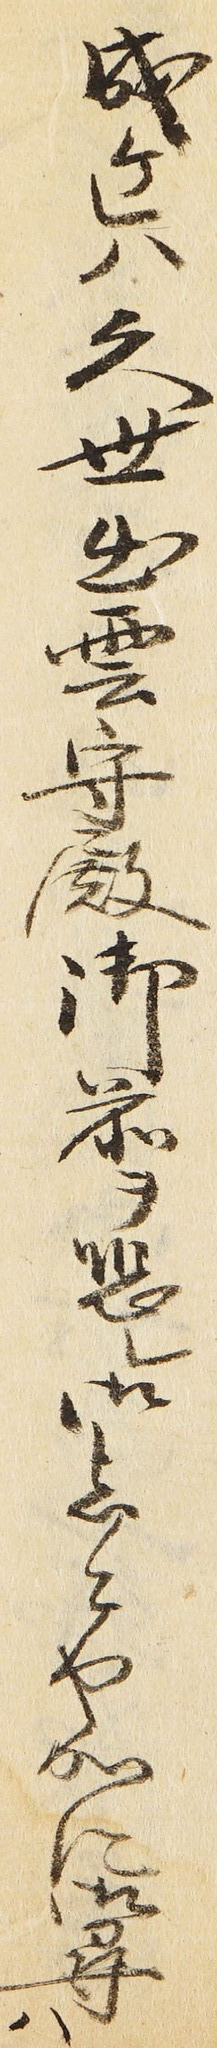成ケレハ久世出雲守殿御前ヲ恐レ御しとやかに御尋は
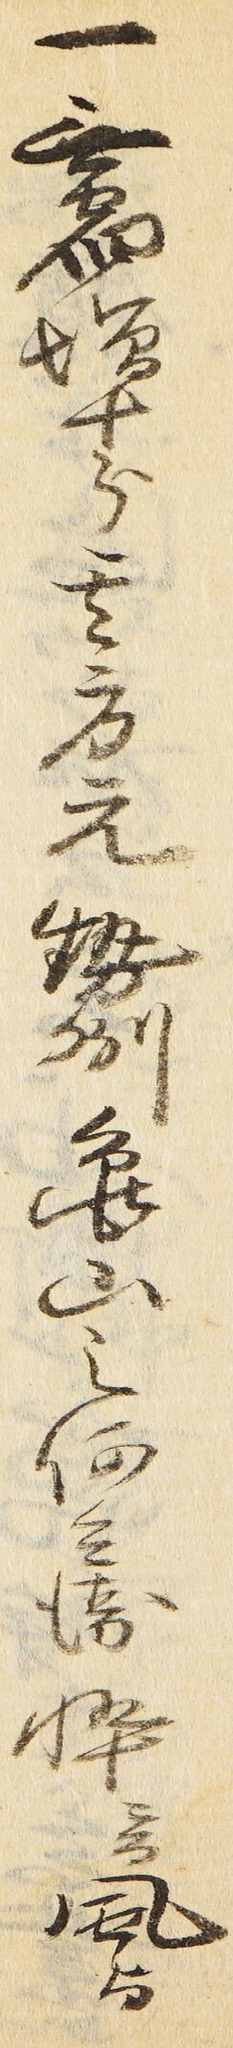一無宿増十郎其方元勢州亀山之何兵衛倅に而風と
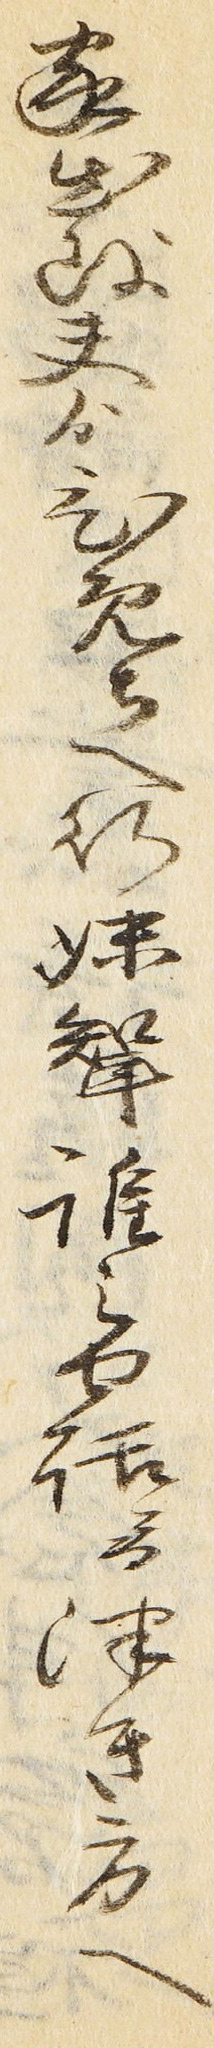家出致夫ゟ飛免ちへ行妹聟誰之せ話に而つき方へ
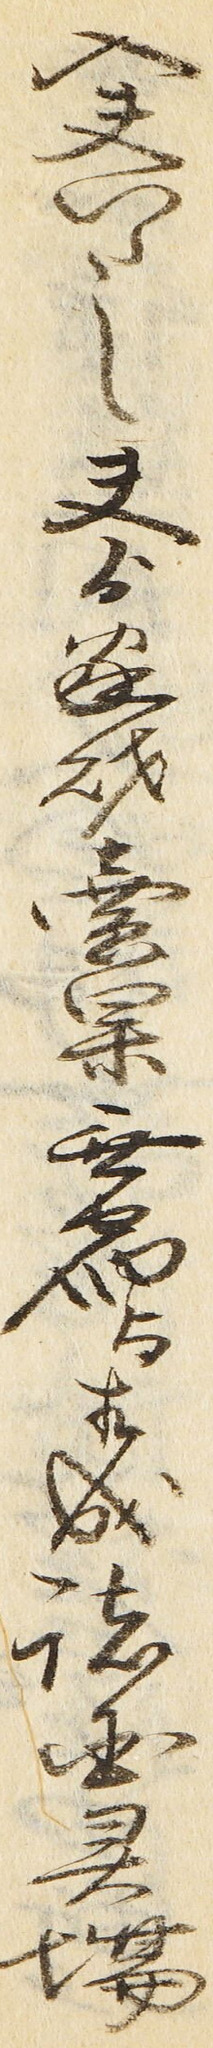入夫いたし夫ゟ家財売果無宿と相成諸国霊場
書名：異流一件日記
